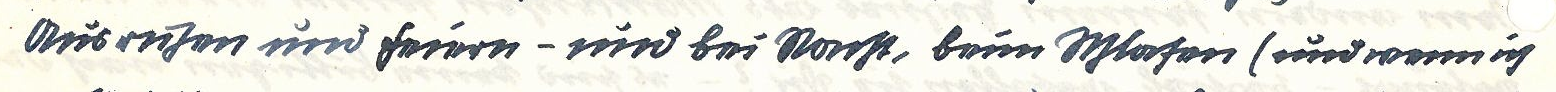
Ausruhen und Feiern – und bei Nacht, beim Schlafen (und wenn ich
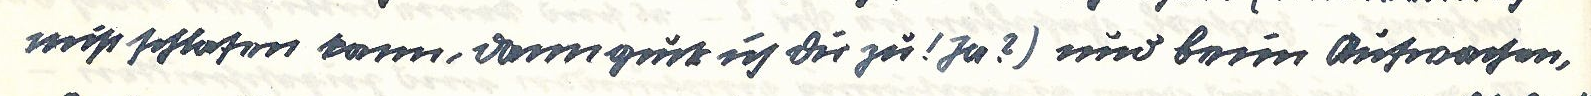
nicht schlafen kann, dann guck ich Dir zu! Ja?) und beim Aufwachen,
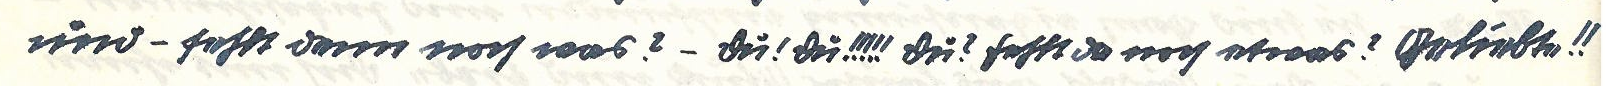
und – fehlt denn noch was? – Du! Du!!!!! Du? Fehlt da noch etwas? Geliebte!
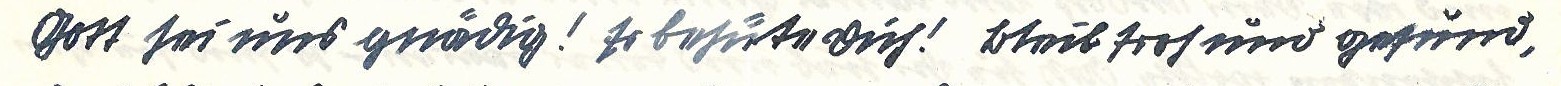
Gott sei uns gnädig! Er behüte Dich! Bleib froh und gesund,
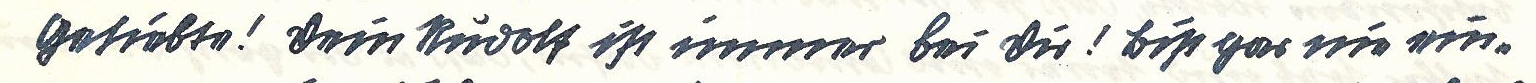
Geliebte! Dein Rudolf ist immer bei Dir! Bist gar nie ein¬
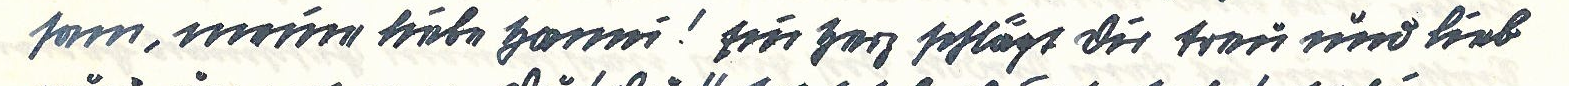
sam, meine liebe! Ein Herz schlägt Dir treu und lieb
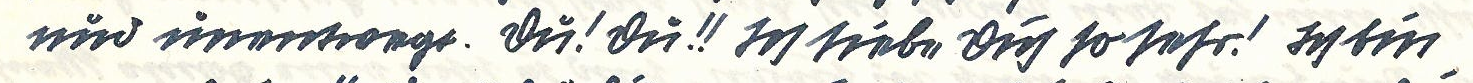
und unentwegt. Du! Du!! Ich liebe Dich so sehr! Ich bin
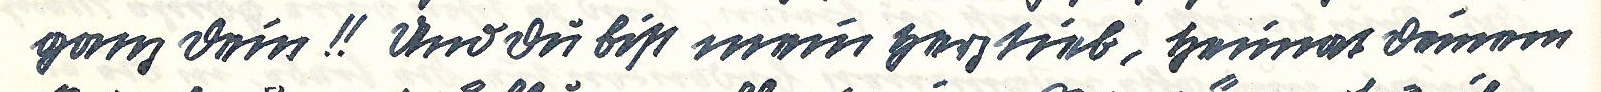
ganz Dein!! Und Du bist mein Herzlieb, Heimat Deinem
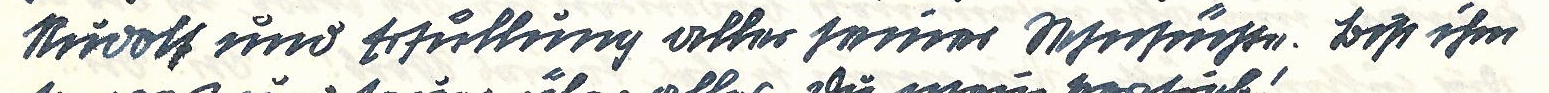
Rudolf und Erfüllung aller seiner Sehnsüchte. Bist ihm
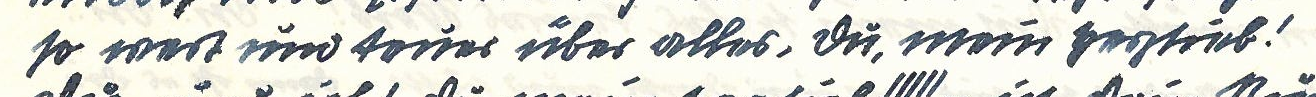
so wert und teuer über alles, Du, mein Herzlieb!
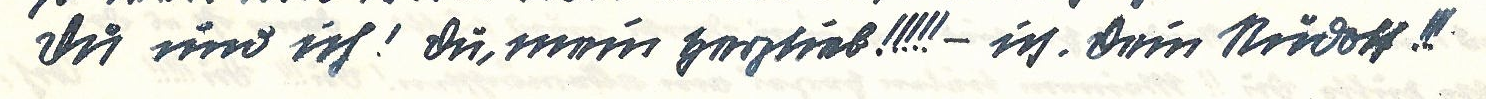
Du und ich! Du, mein Herzlieb!!!!! – ich, Dein Rudolf!!!
